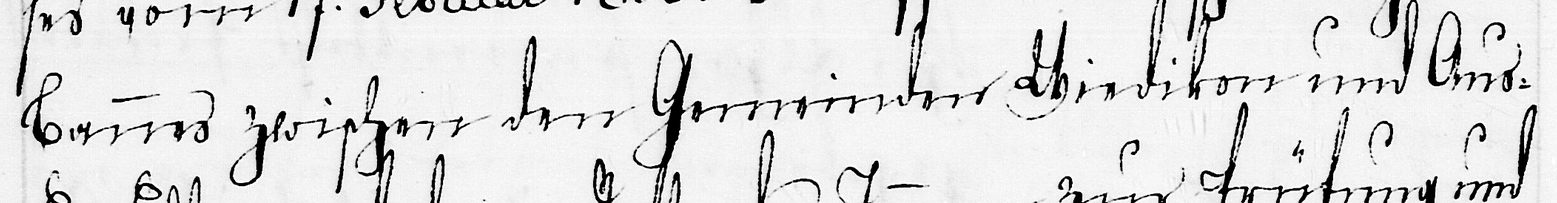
Bannes zwischen den Gemeinden Wiedikon und Auß¬
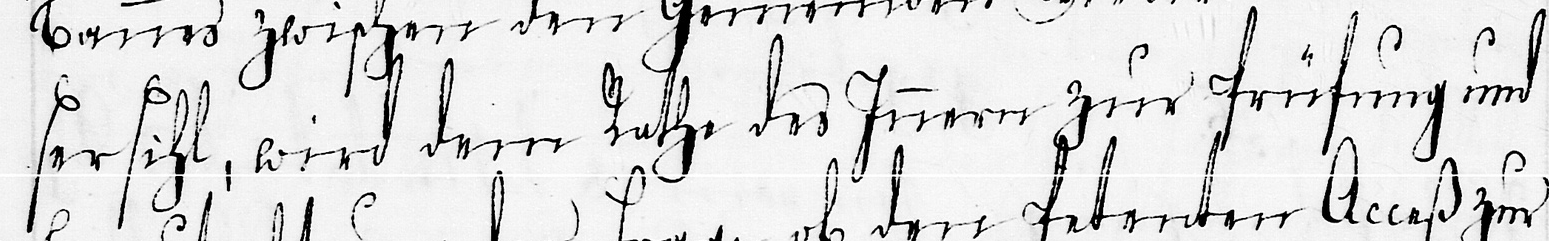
ersihl, wird dem Rathe des Innern zur Prüfung und
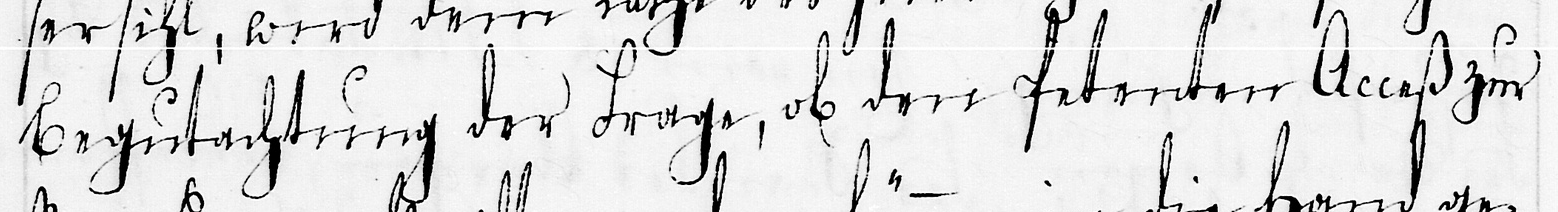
Begutachtung der Frage, ob den Petenten Acceß zur
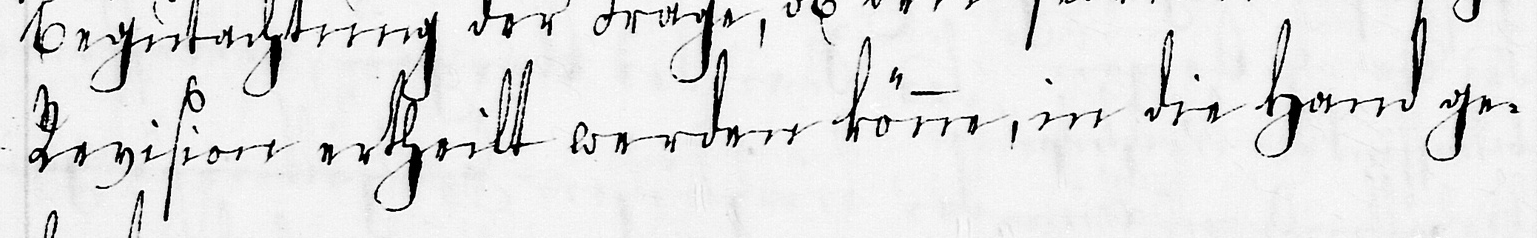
Revision ertheilt werden könne, in die Hand ge¬
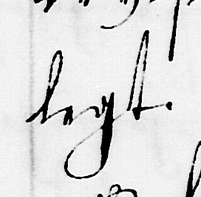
legt.
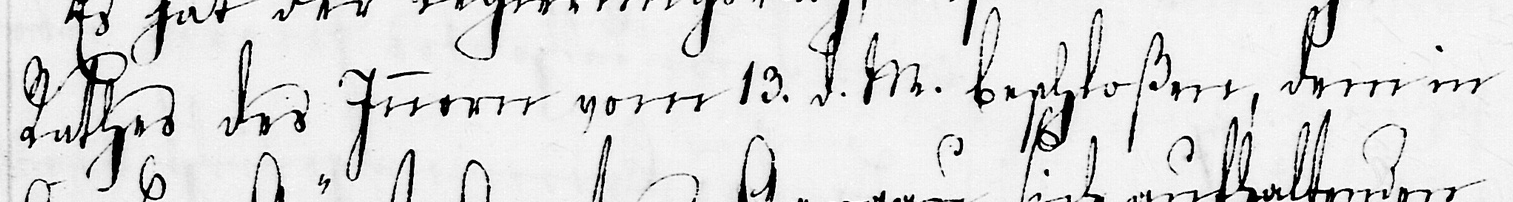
Rathes des Innern vom 13. d. M. beschloßen, dem in
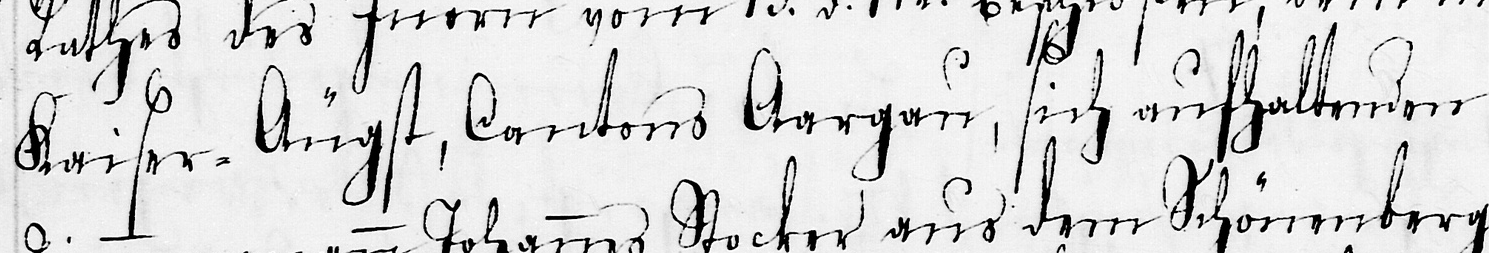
Kaiser-Äugst, Cantons Aargau, sich aufhaltenden
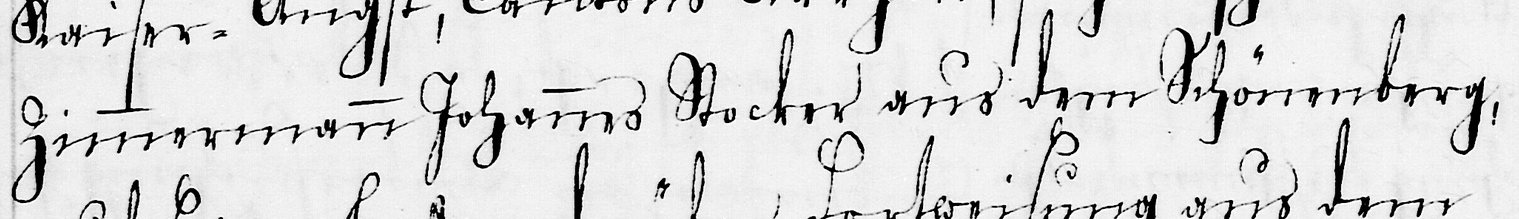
Zimmermann Johannes Stocker aus dem Schönenberg,
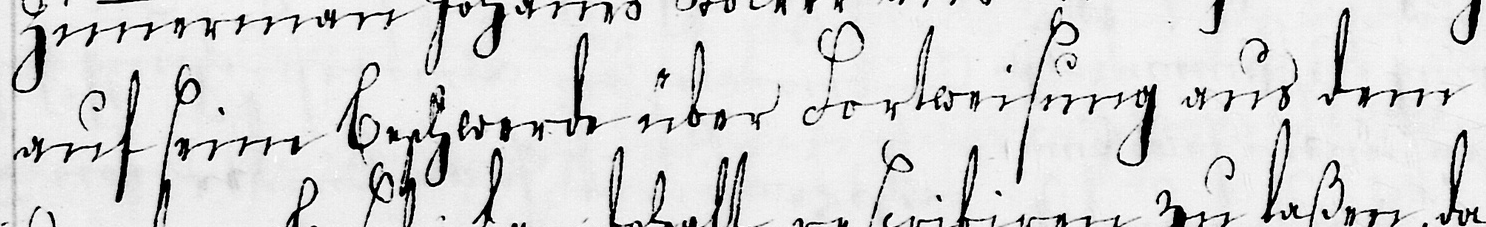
auf seine Beschwerde über Fortweisung aus dem
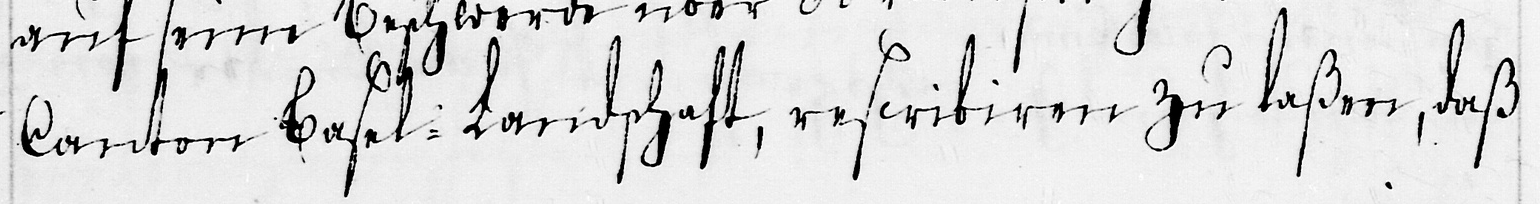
Canton Basel-Landschaft, rescribiren zu laßen, daß
